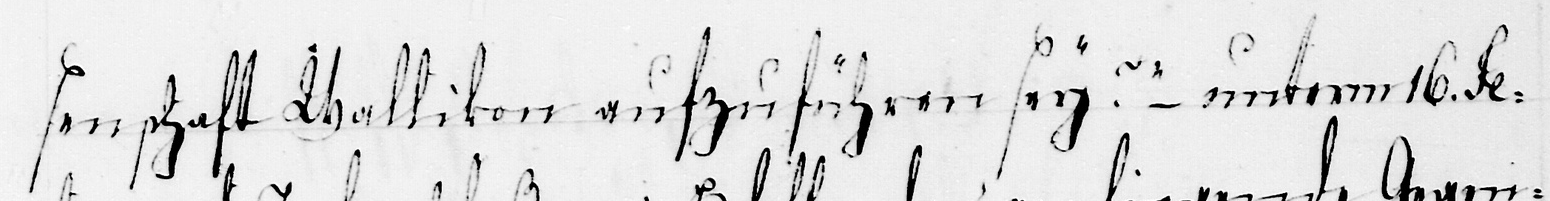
senschaft Wallikon aufzuführen sey?“ – unterm 16. Fe¬
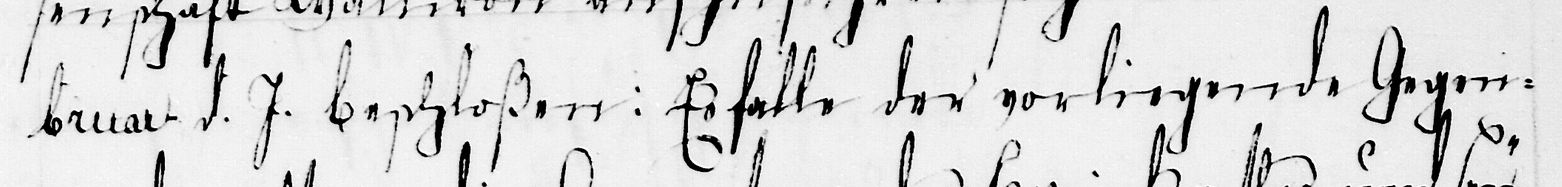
bruar d. J. beschloßen: Es falle der vorliegende Gegen¬
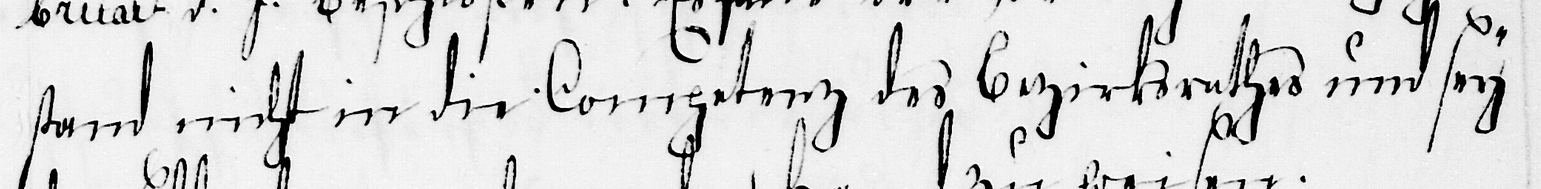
stand nicht in die Competenz des Bezirksrathes und sey
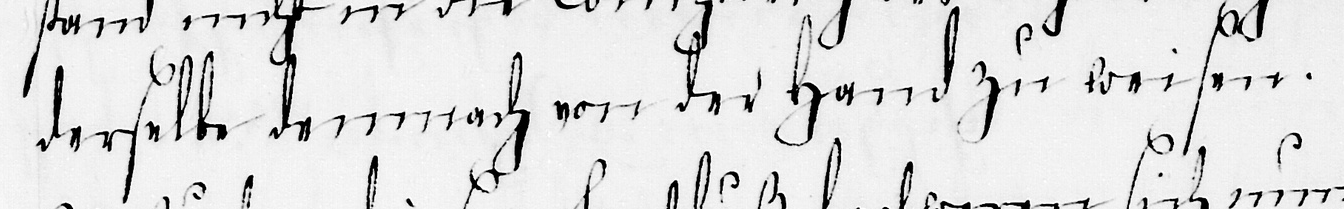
derselbe demnach von der Hand zu weisen.
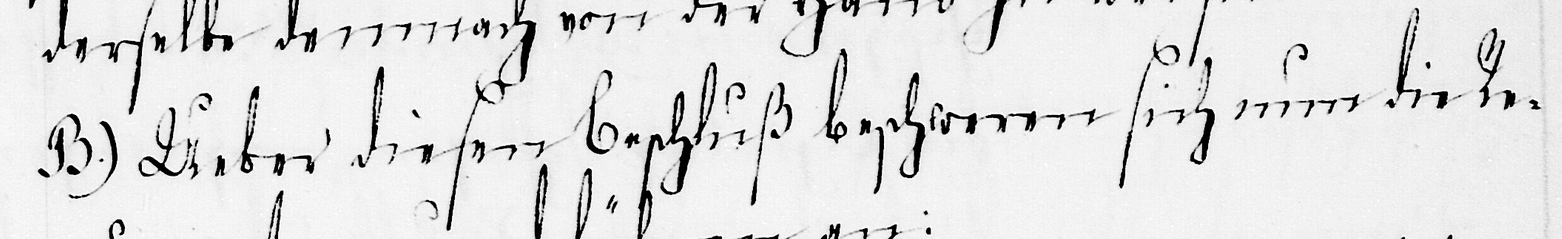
B.) Ueber diesen Beschluß beschweren sich nun die Re¬
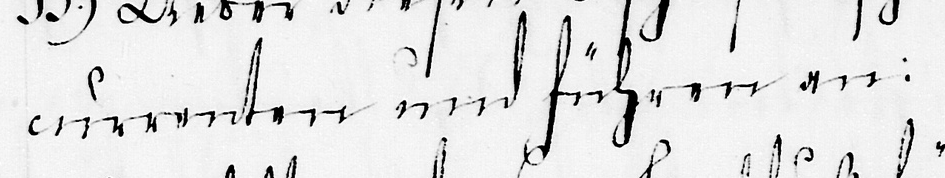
currenten und führen an:
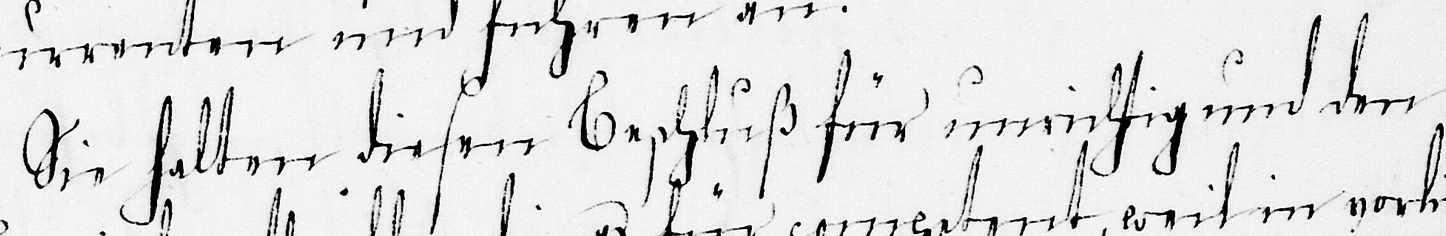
Sie halten diesen Beschluß für unrichtig und den
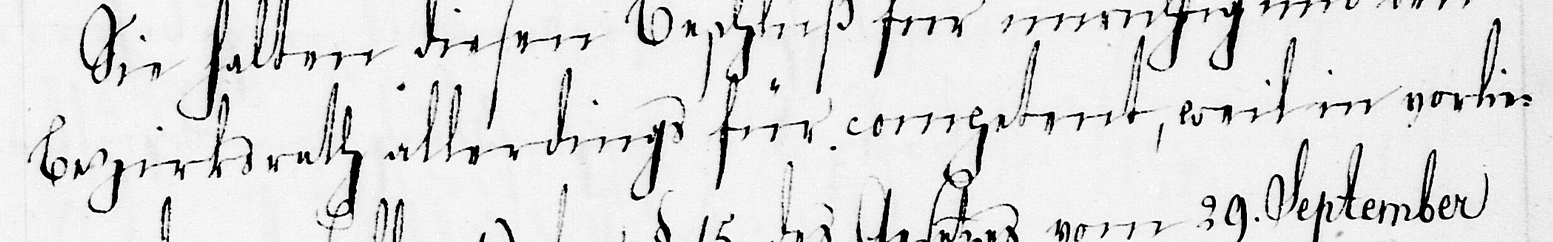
Bezirksrath allerdings für competent, weil in vorlie¬
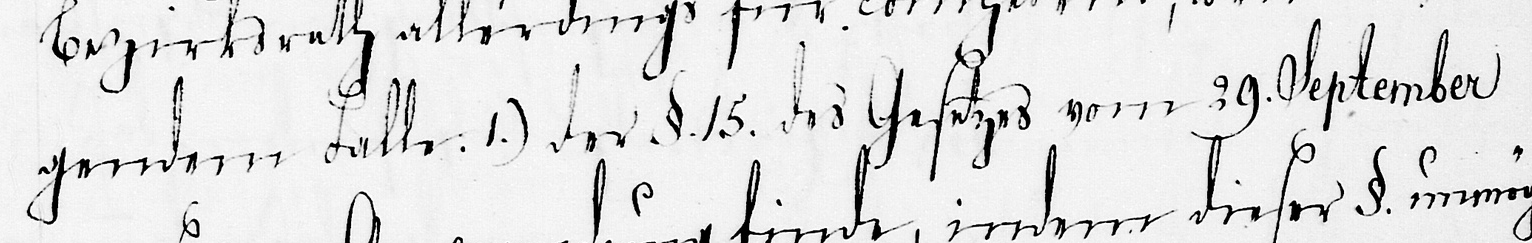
gendem Falle: 1.) der §. 15. des Gesetzes vom 29. September
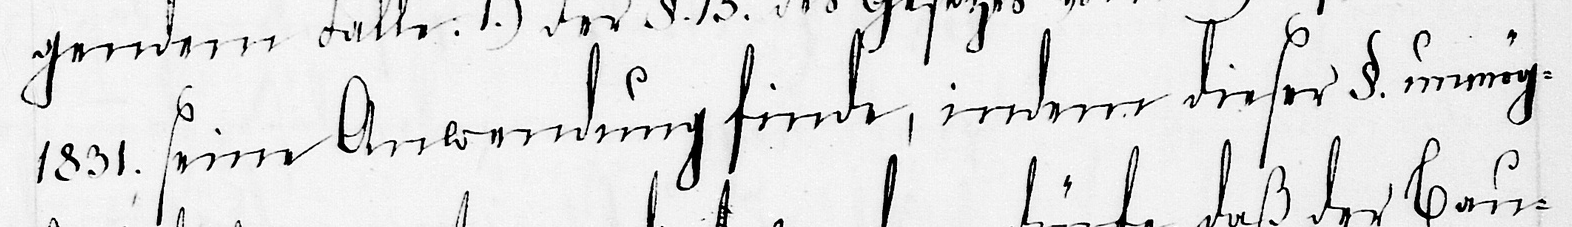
1831. seine Anwendung finde, indem dieser §. unmög¬
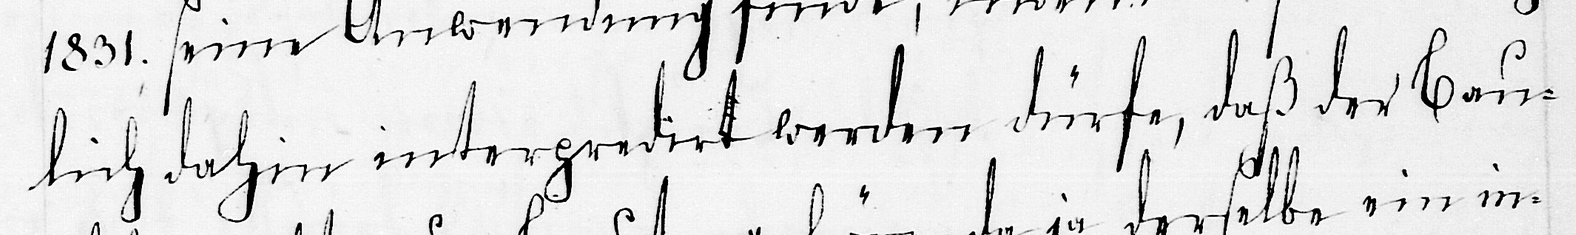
lich dahin interpredirt werden dürfe, daß der Bau¬
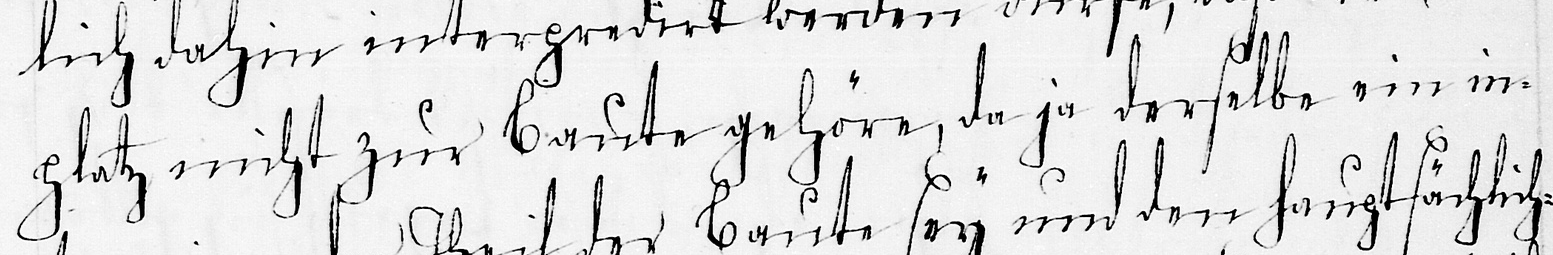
platz nicht zur Baute gehöre, da ja derselbe ein in¬
